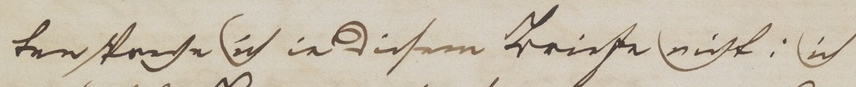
ten spreche ich in diesem Briefe nicht: ich
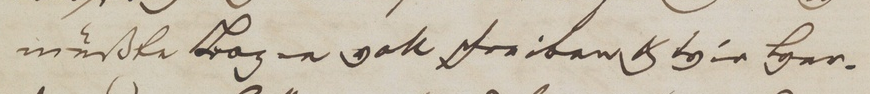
müßte Bogen voll schreiben & wir wer-
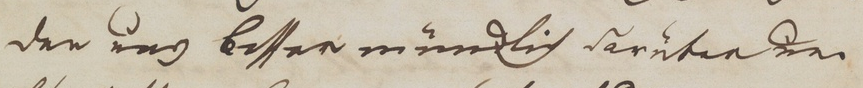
den uns besser mündlich darüber un-
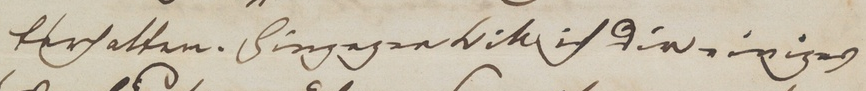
terhalten. Hingegen will ich dir einiges
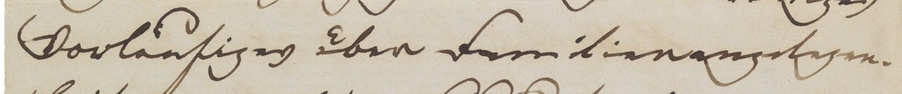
Vorläufiges über Familienangelegen-
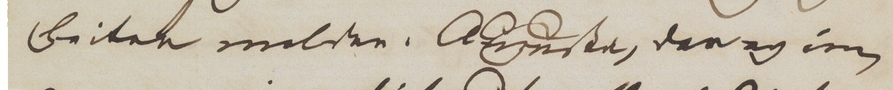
heiten melden. Augusta, der es im
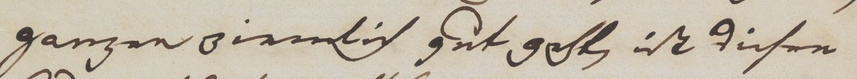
ganzen ziemlich gut geht, ist diesen
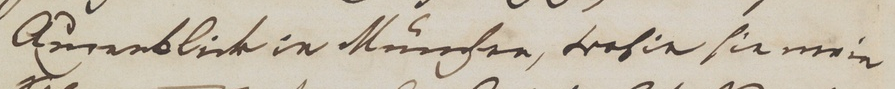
Augenblick in München, wohin sie mein
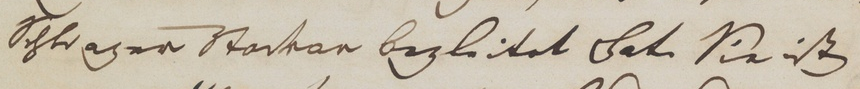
Schwager Stockar begleitet hat. Sie ist
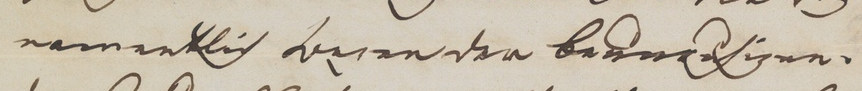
namentlich wegen der beunruhigen-
